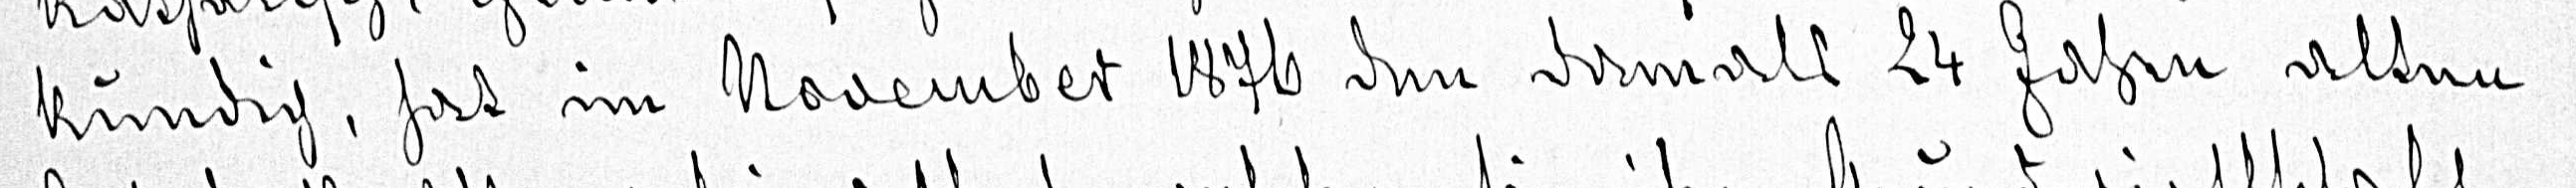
kundig, hat im November 1876 den damals 24 Jahre alten
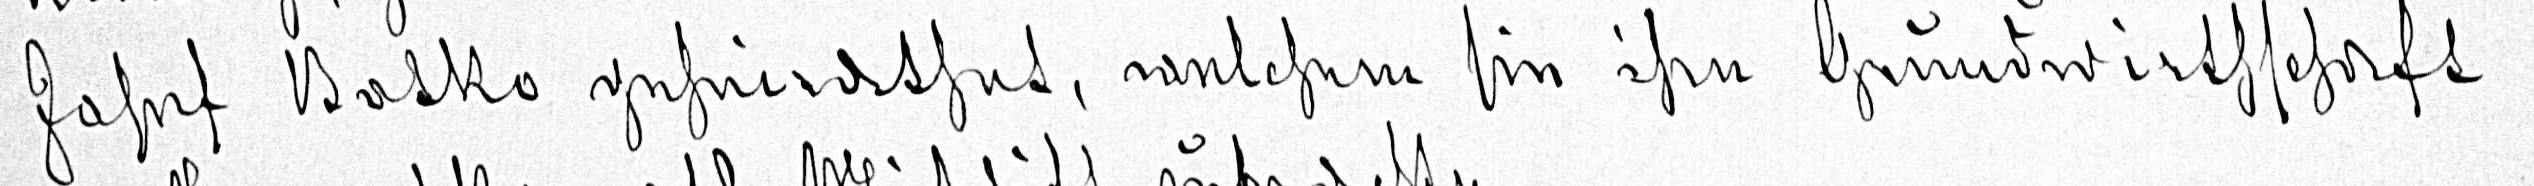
Josef Botko geheirathet, welchem sie ihre Grudnwirthschaft
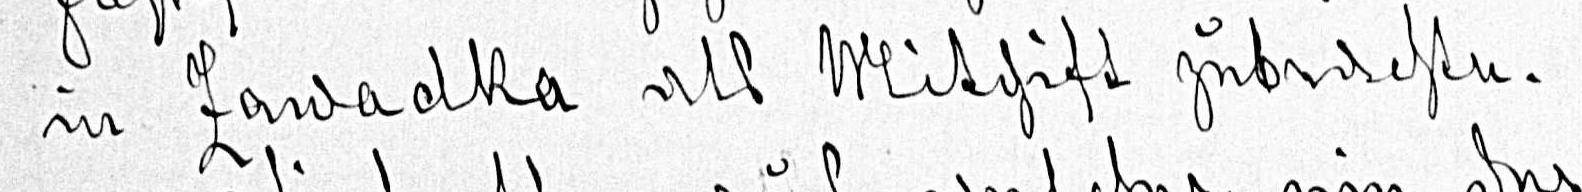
in Zawadka als Mitgift zubrachte.
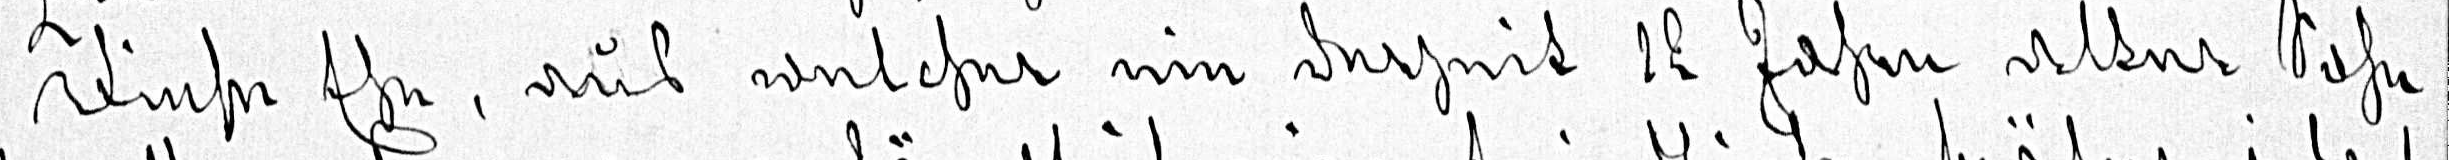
Diese Ehe, aus welcher ein derzeit 22 Jahre alter Sohn
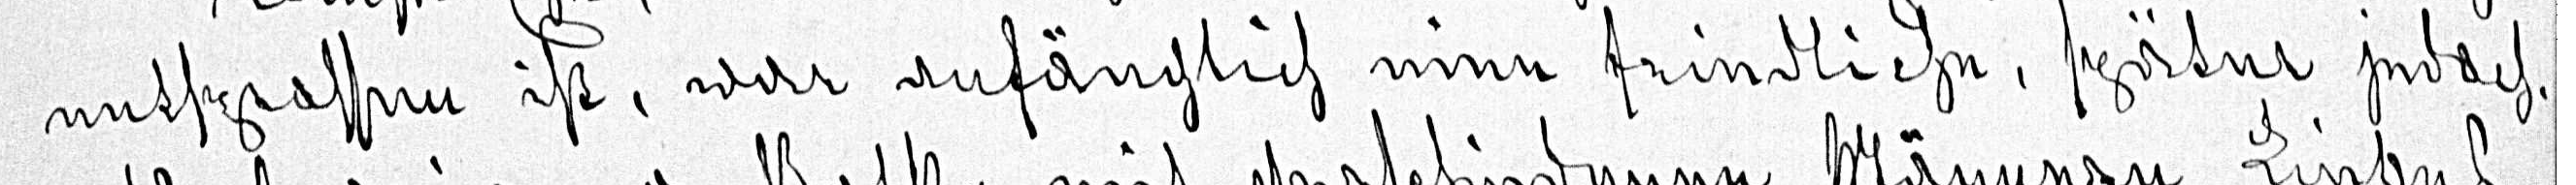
entsprossen ist, war anfänglicht eine friedliche, später jeoch
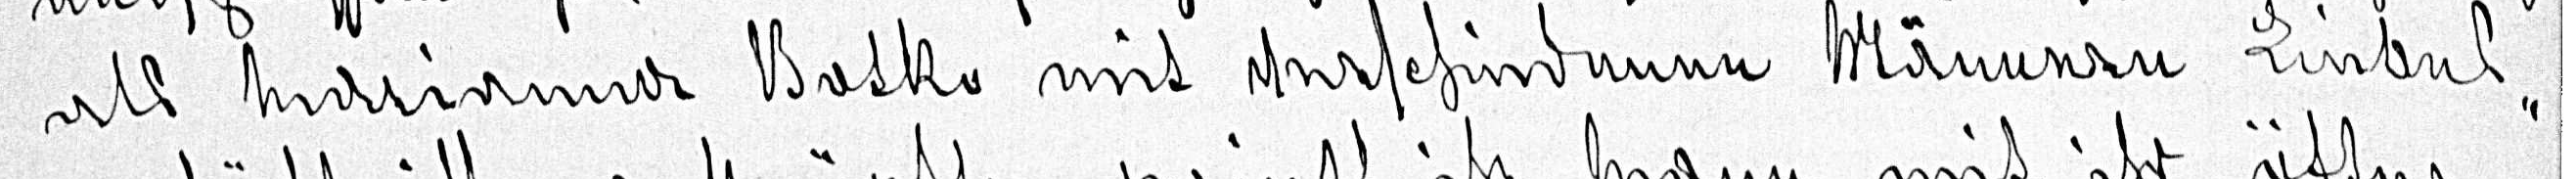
als Marianna Botko mit vershciedenen Männern Liebes¬
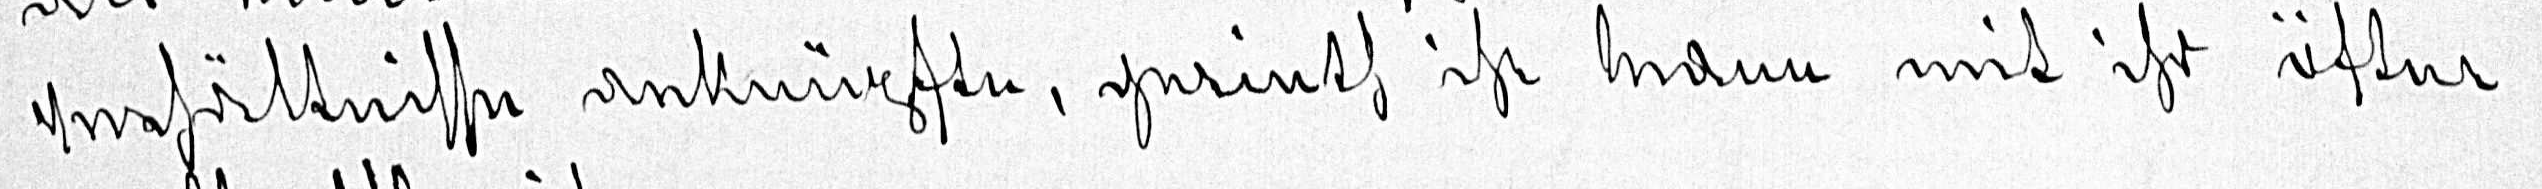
verhältnisse anknüpfte, gerieth ihr Mann mit ihr öfter
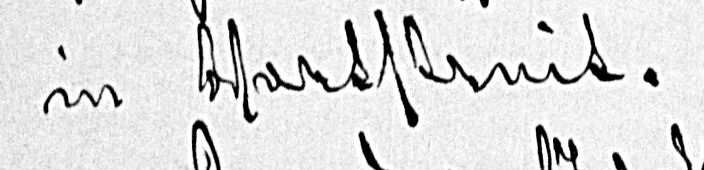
in Wortstreit.
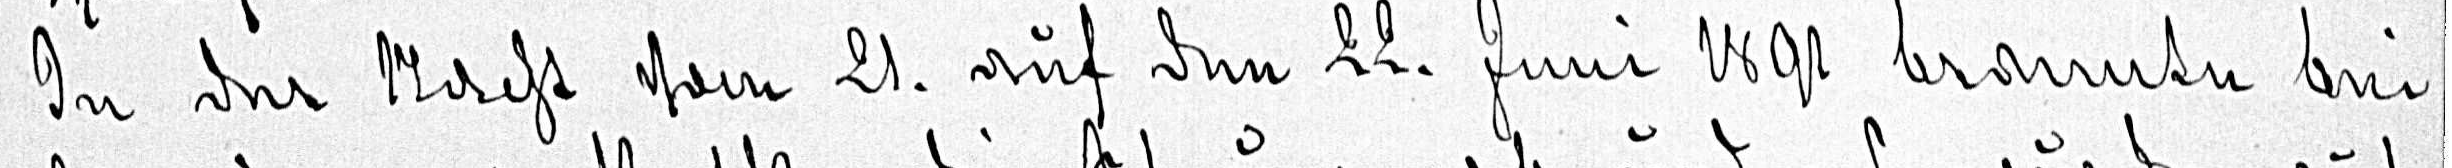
In der Nacht vom 21. Auf den 22. Juni 1891 brannte bei
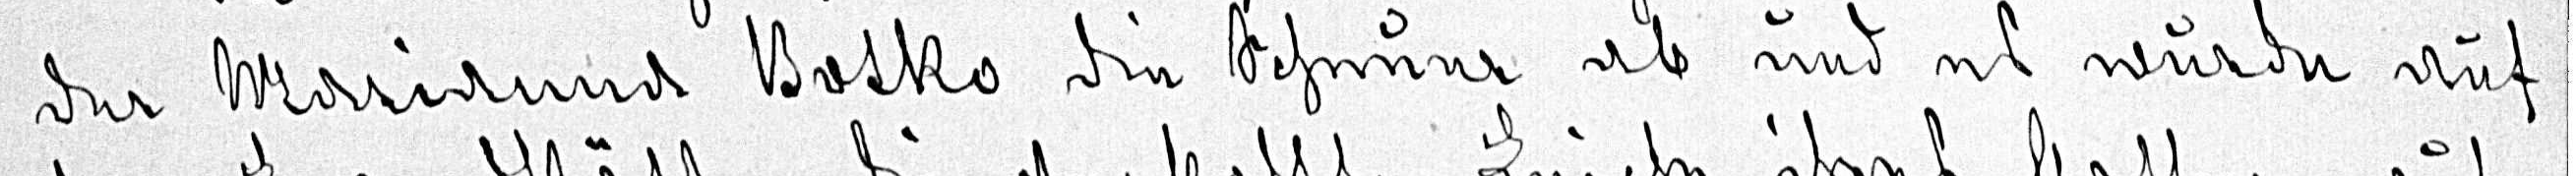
der Marianna Botko die Schnure ab und es wurde auf
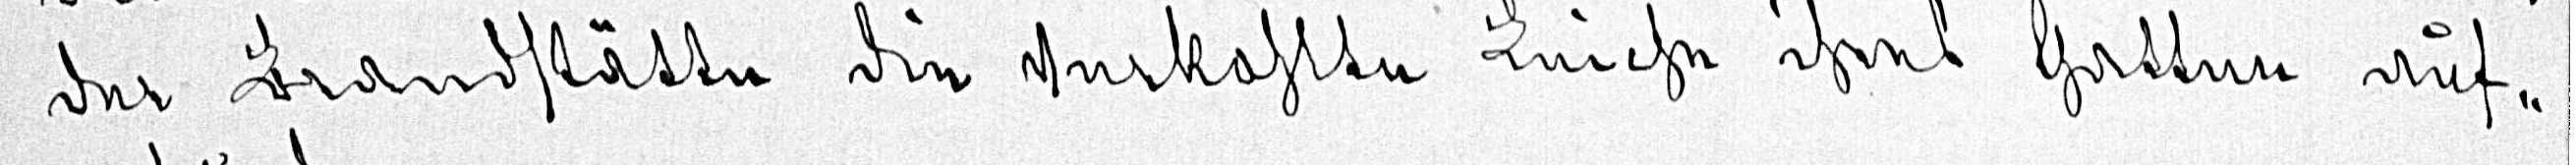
der Brandstätte die verkohlte Leiche ihres Gatten auf¬
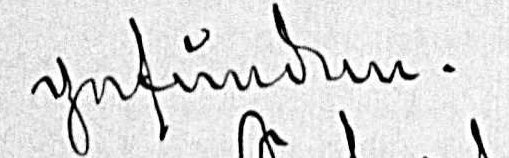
gefunden.
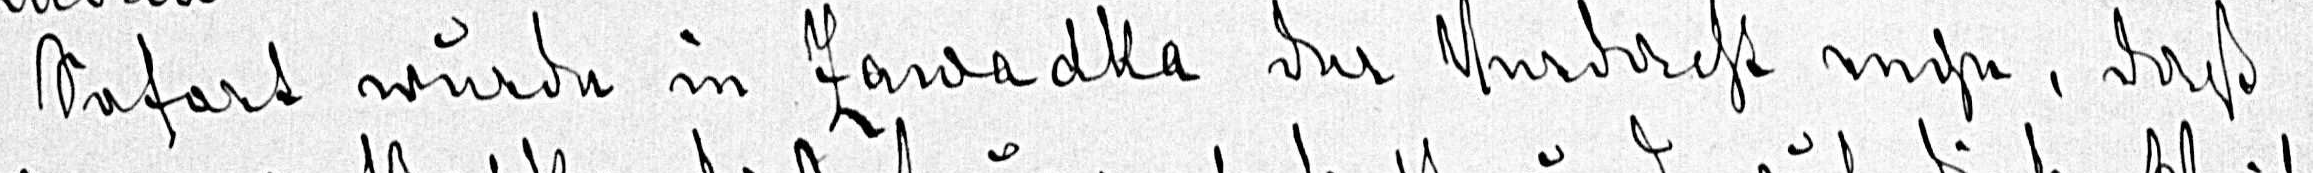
Sofort wurde in Zawadka der Verdacht rege, daß
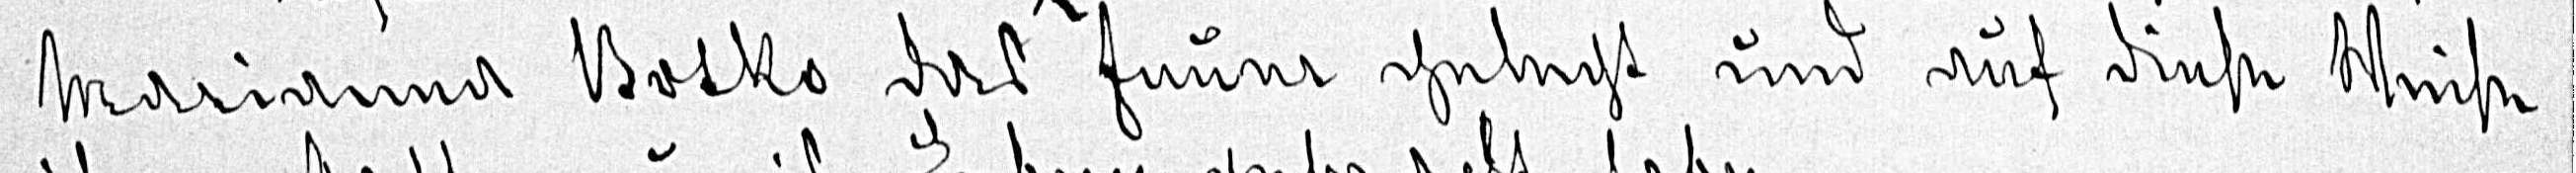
Marianna Botko das Feuer gelegt und auf diese Weise
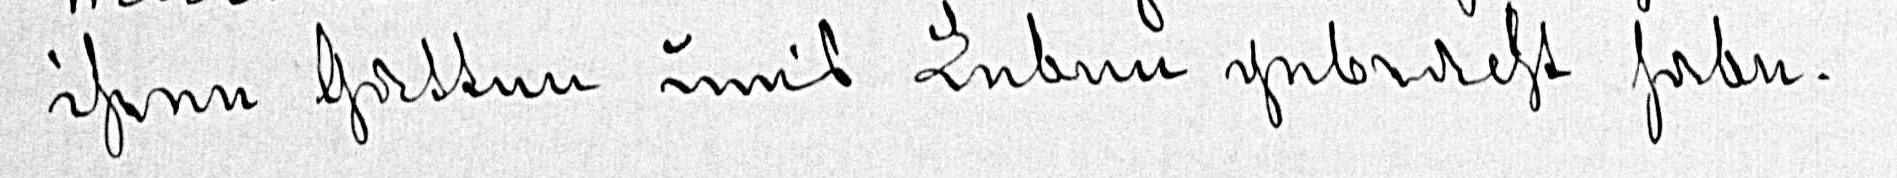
ihren Gatten ums Leben gebracht habe.
